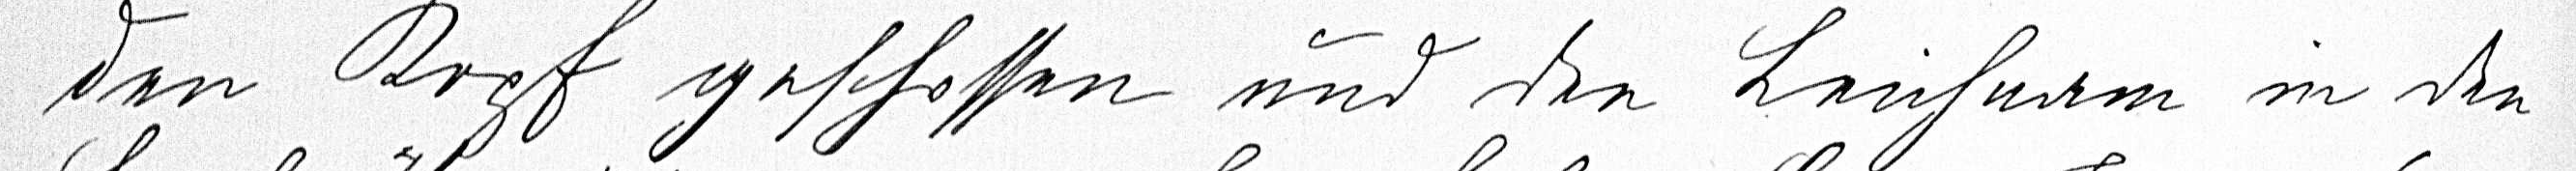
den Kopf geschossen und den Leichnam in den
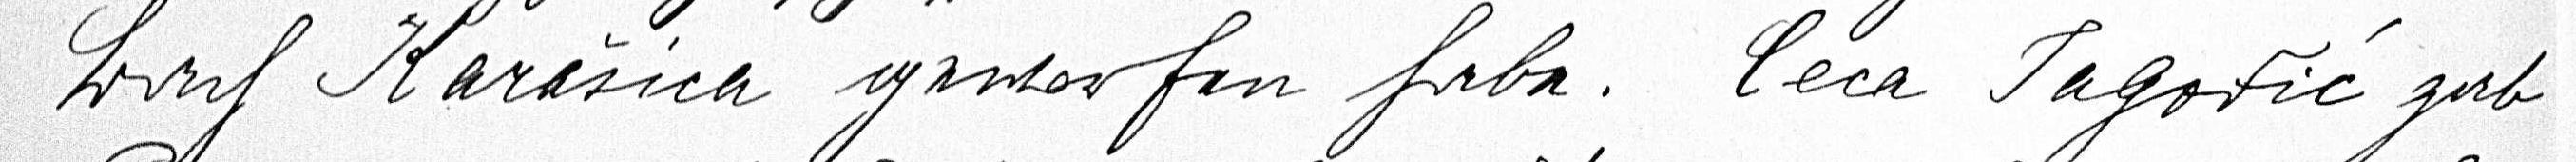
Bach Karašica geworfen habe. Ceca Jagodić gab
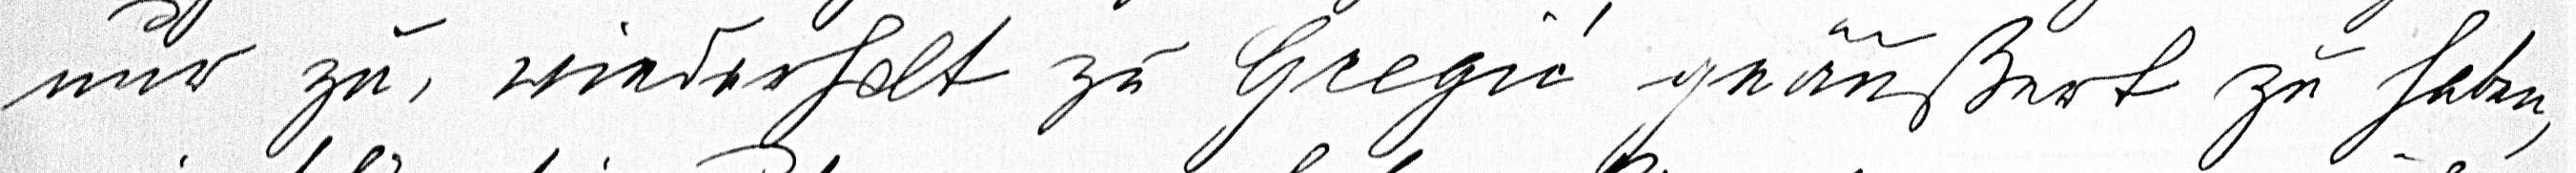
nur zu, wiederholt zu Gregić geäußert zu haben,
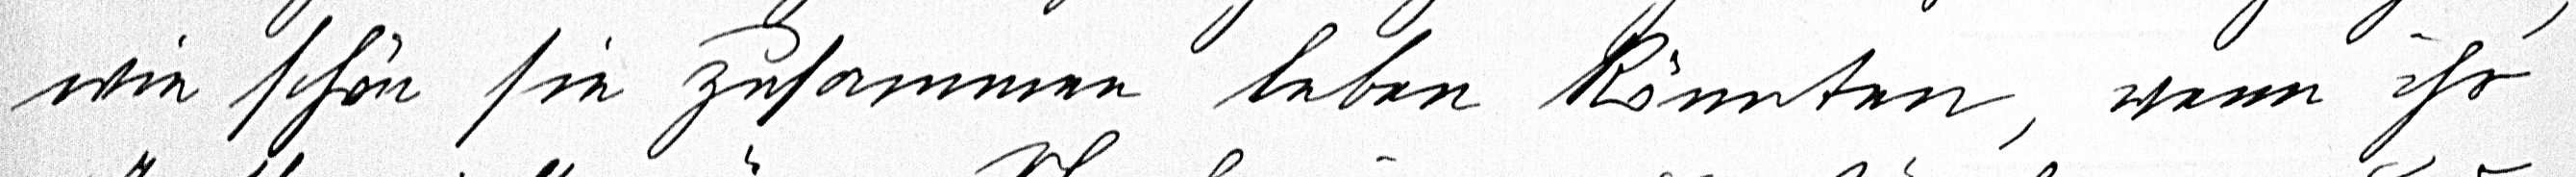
wie schön sie zusammen leben könnten, wenn ihr
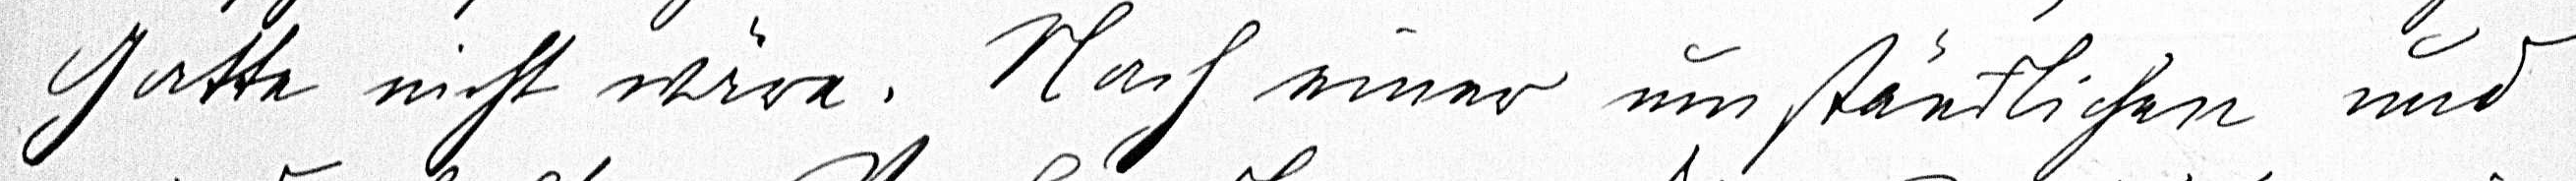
Gatte nicht wäre. Nach einer umständlichen und
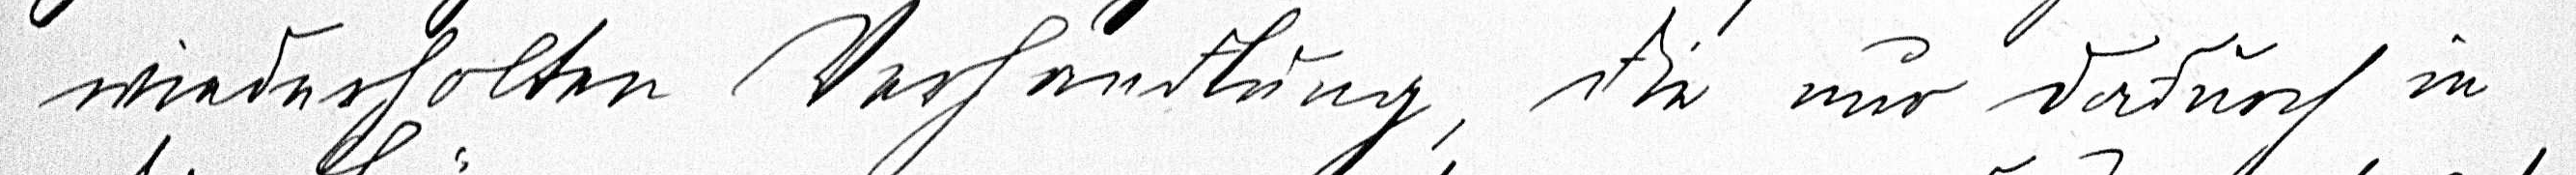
wiederholten Verhandlung, die nur dadurch in
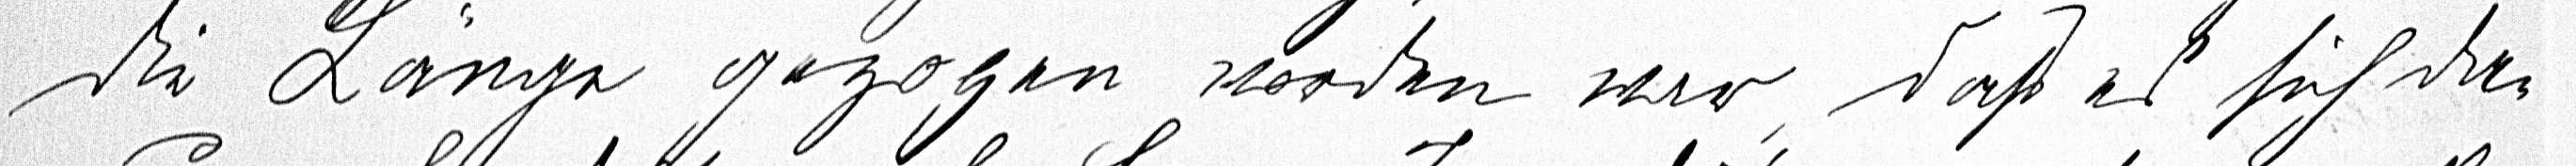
die Länge gezogen worden war, daß es sich da¬
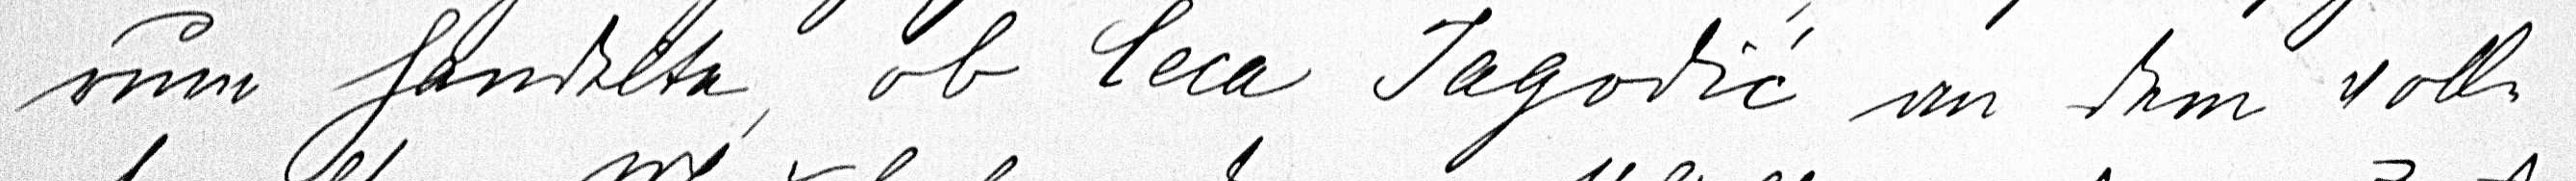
rum handelte, ob Ceca Jagodić an dem voll¬
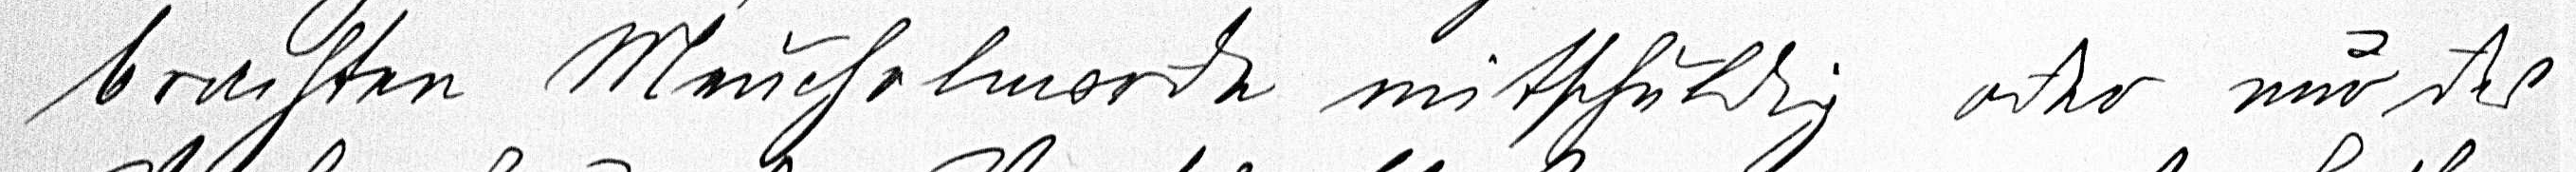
brachten Meuchelmorde mitschuldig oder nur des
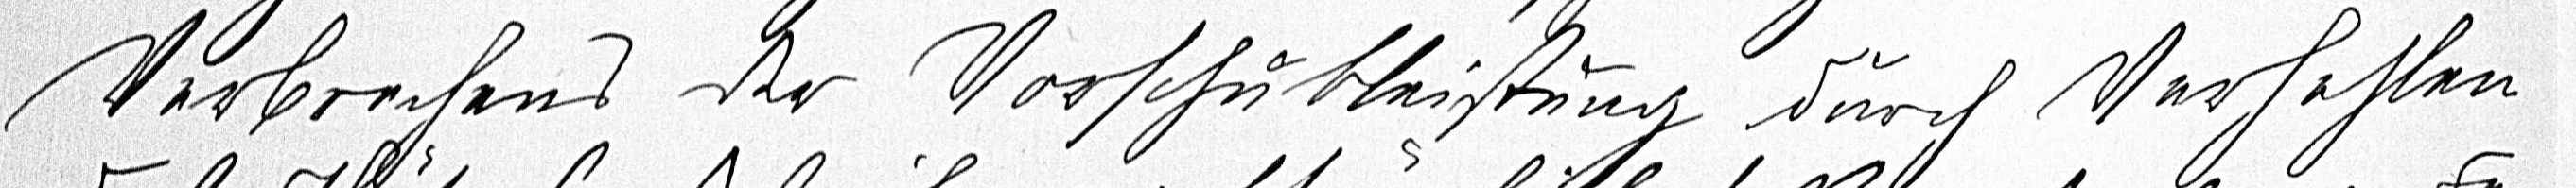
Verbrechens der Vorschubleistung urch Verhalten
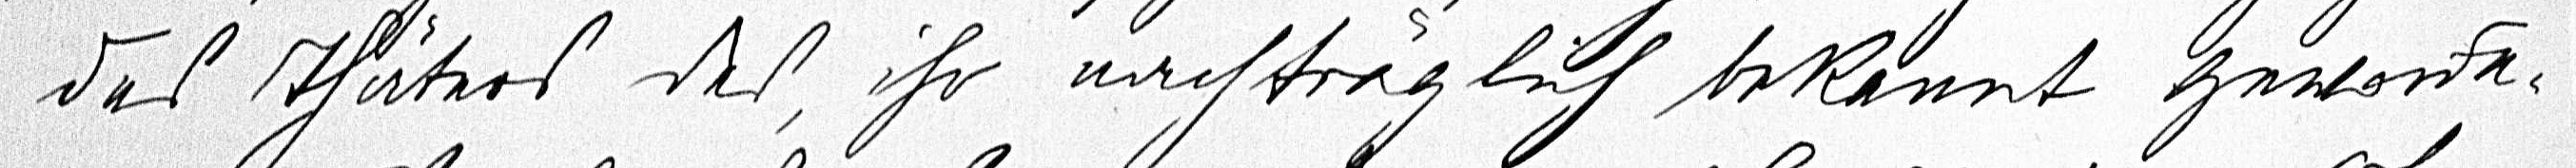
des Thäters des, ihr nachträglich bekannt geworde¬
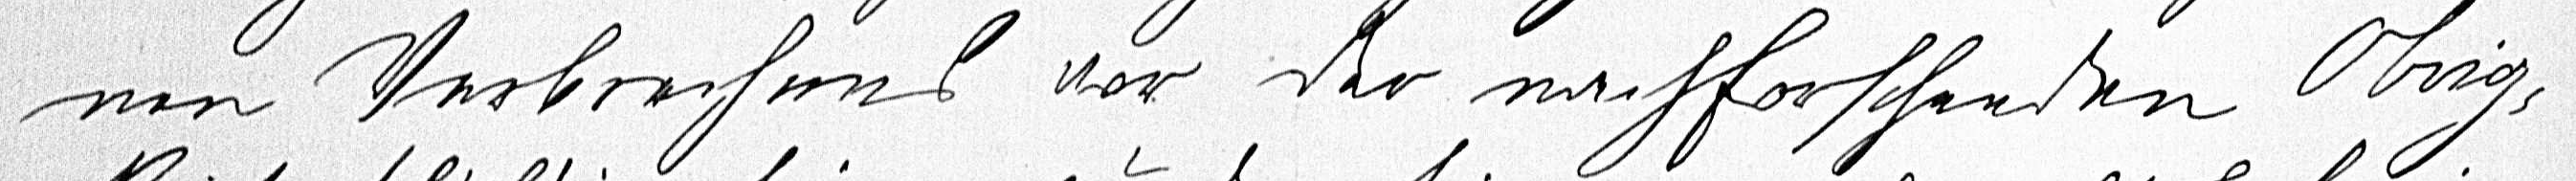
nen Verbrechens vor der nachforschenden Obrig¬
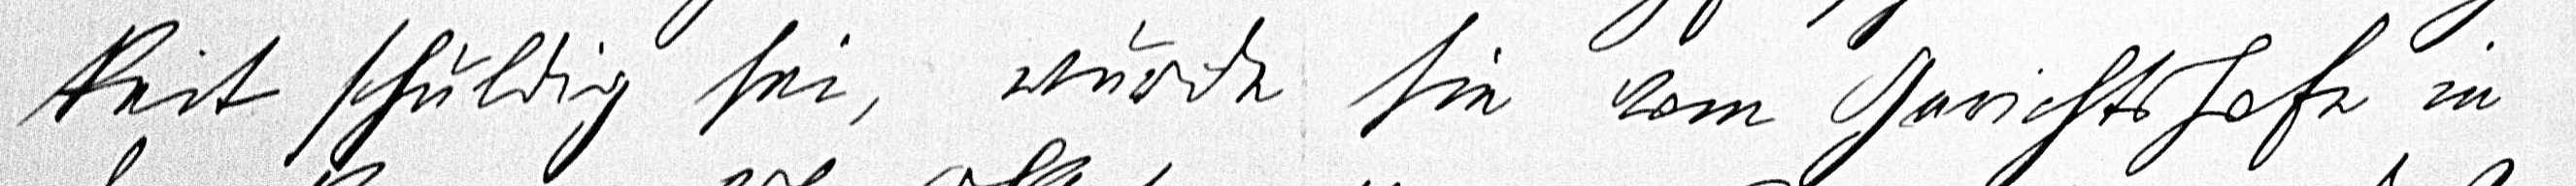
keit schuldig sei, wurde sie vom Gerichtshof in
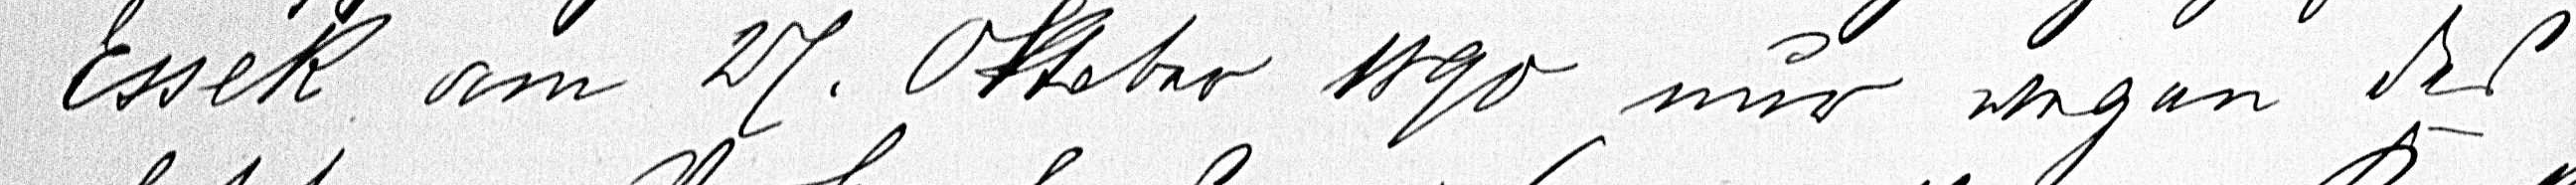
Essek am 27. Oktober 1890 nur wegen des
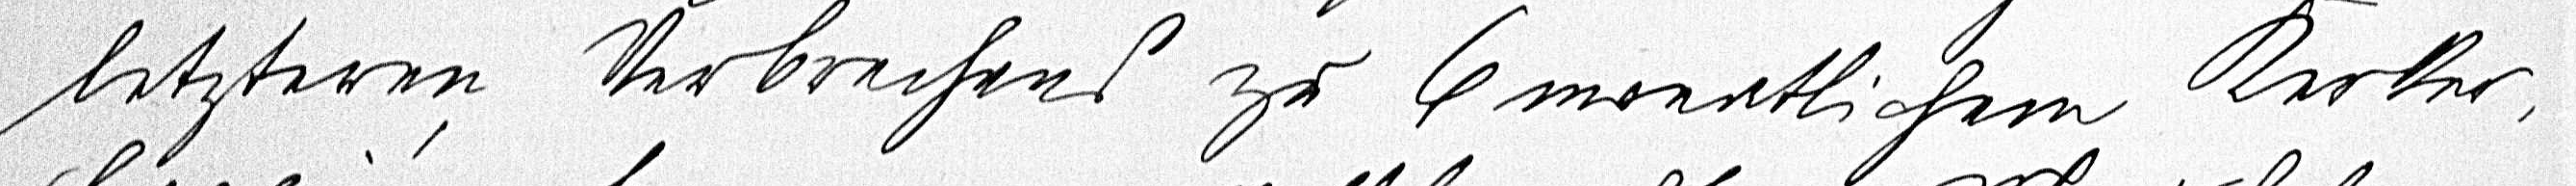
letzteren Verbrechens zu 6monatlichen Kerker,
